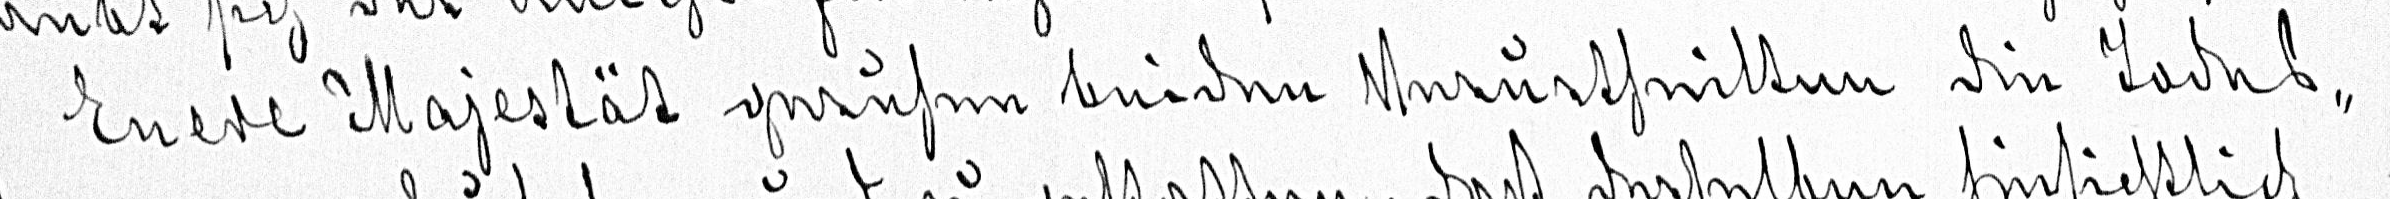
Enere Majestät geruhen beiden Verurtheilten die Todes¬
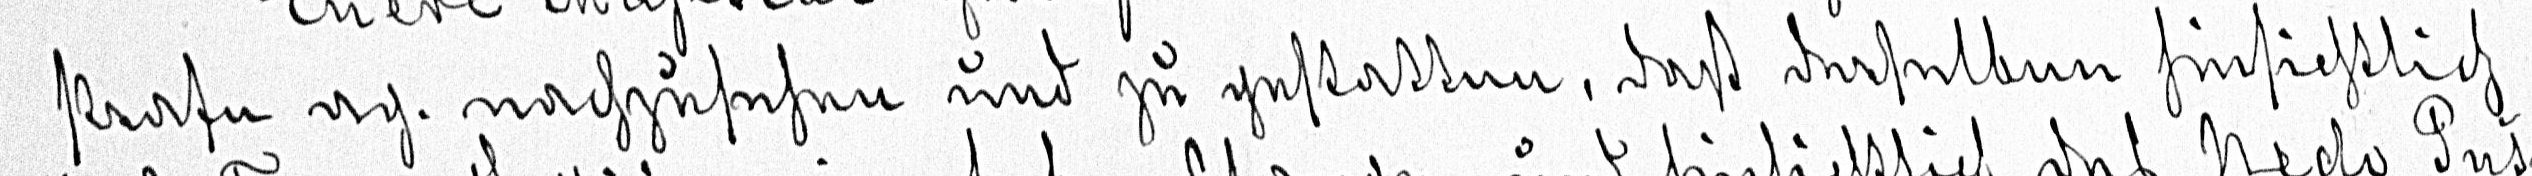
strafe ag. nachzusehen und zu gestatten, daß derselben hinsichtlich
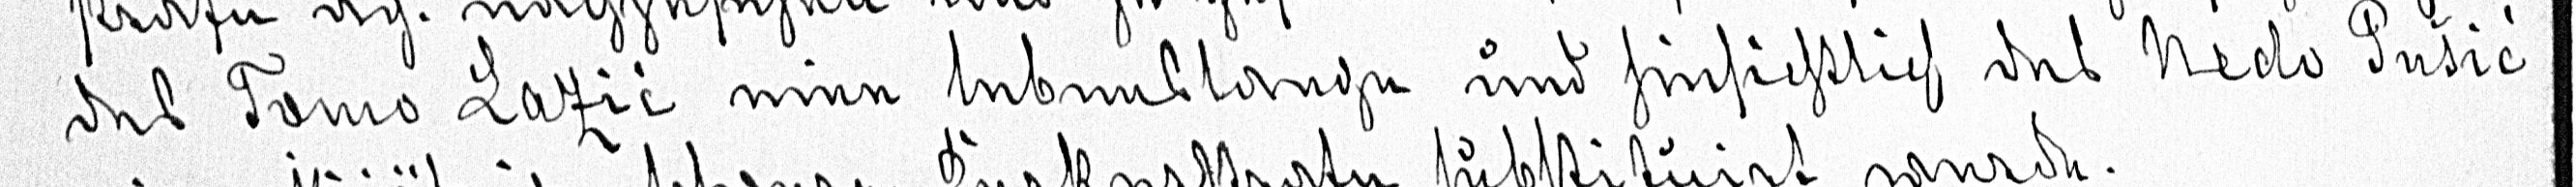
des Tomo Lazić eine lebenslange und hinsichtlich des Nedo Pusić
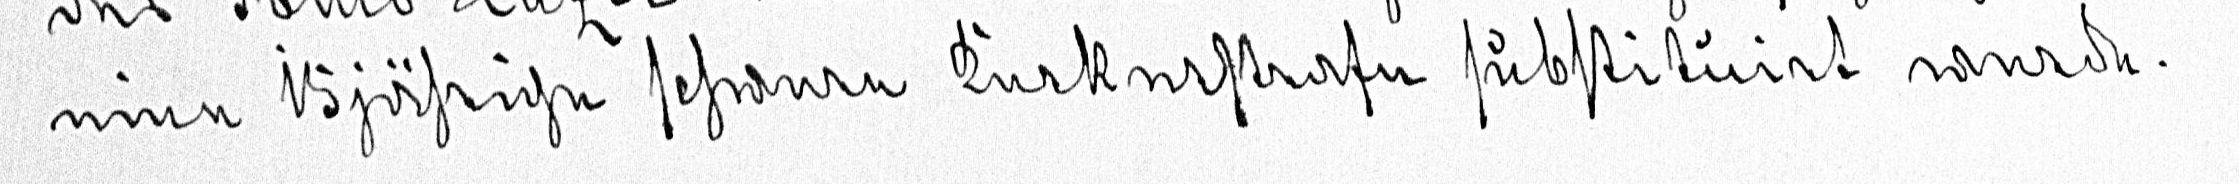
eine 15 jährige schwere Kerkerstrafe substituirt wurde.
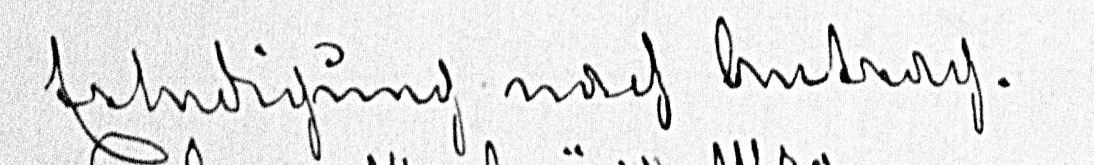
Erledigung nach Antrag.
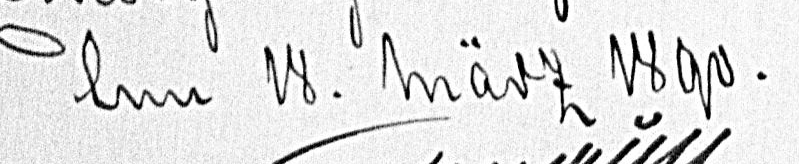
Am 18. März 1890
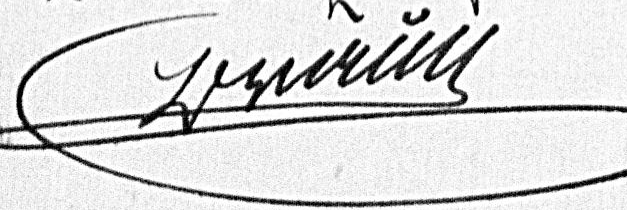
xx
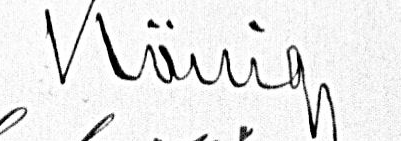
König
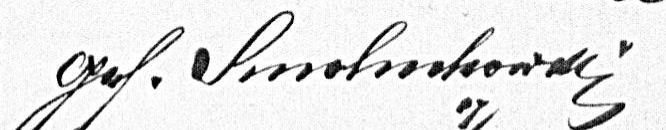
ges. Smolmhowdt
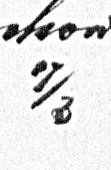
01/2
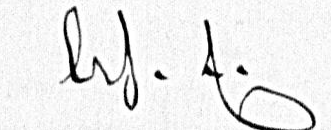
As. E.
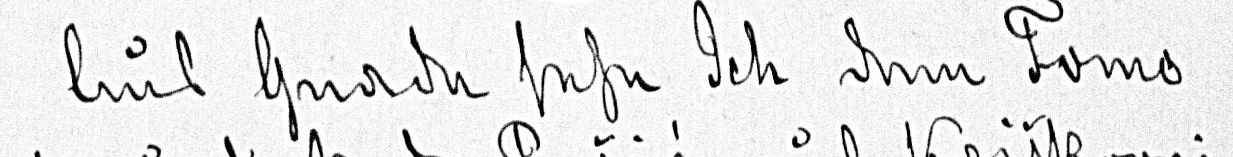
Aus Gnade sehn Ich dam Tomo
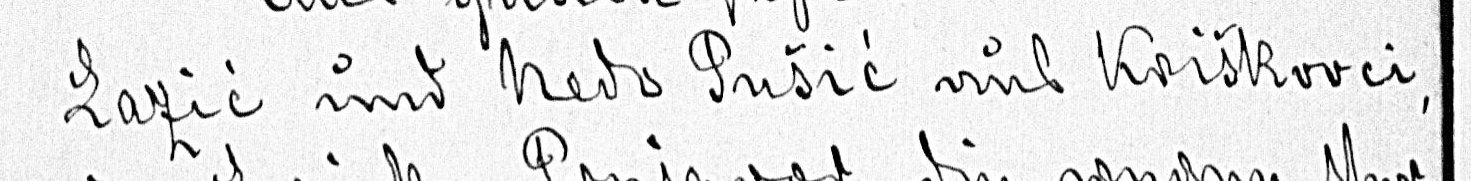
Lazić und Nedo Pusić aus Kriskovci,
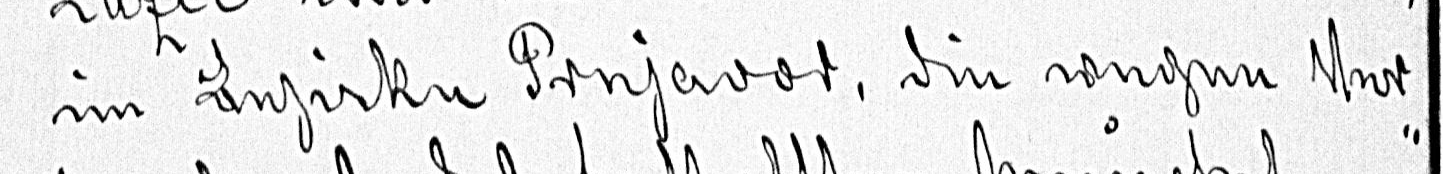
im Bezirke Prnjavor, die wegen Vor¬
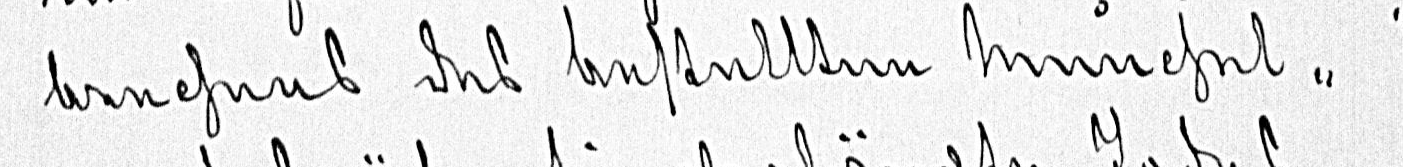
brechens des bestellten Meuchel¬
